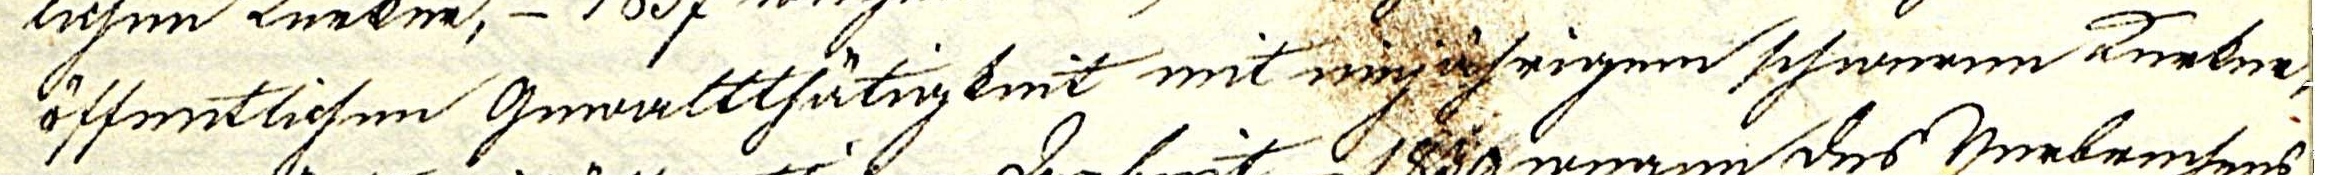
öffentlichen Gewaltthätigkeit mit einjährigem schweren Kerker,
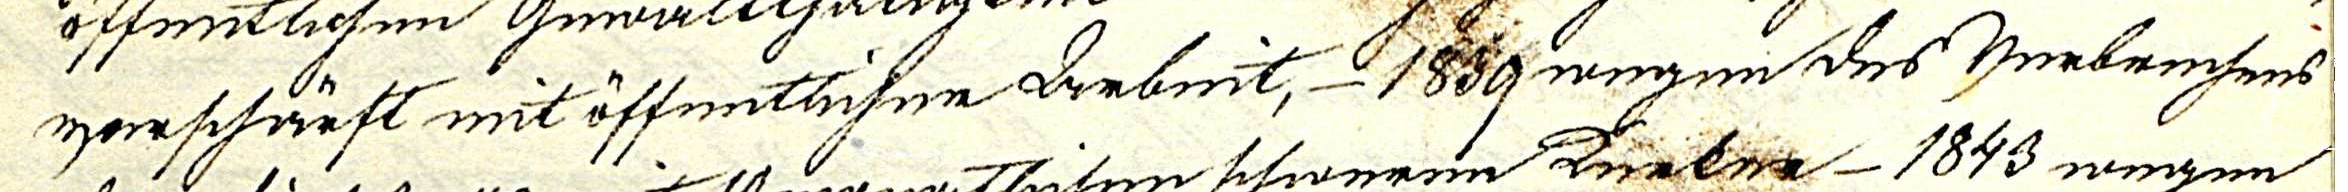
verschärft mit öffentlicher Arbeit, - 1839 wegen des Verbrechens
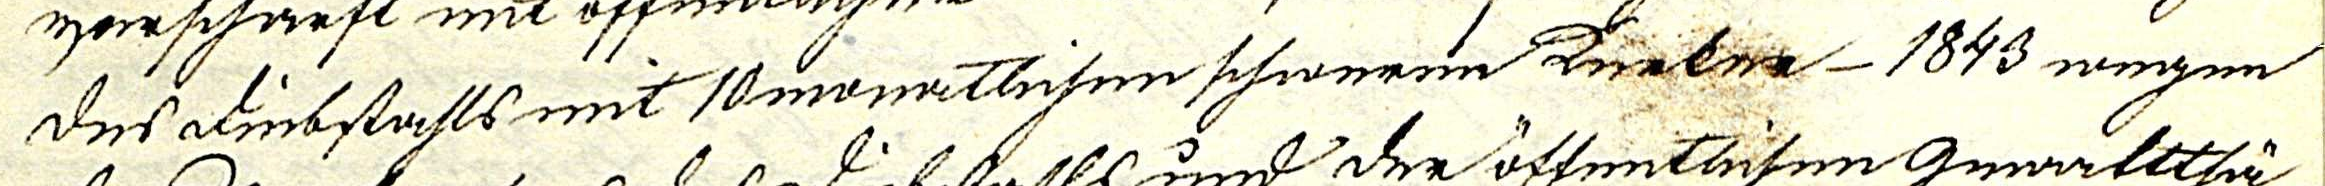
des Diebstahls mit 10monatlichen schweren erker – 1843 wegen
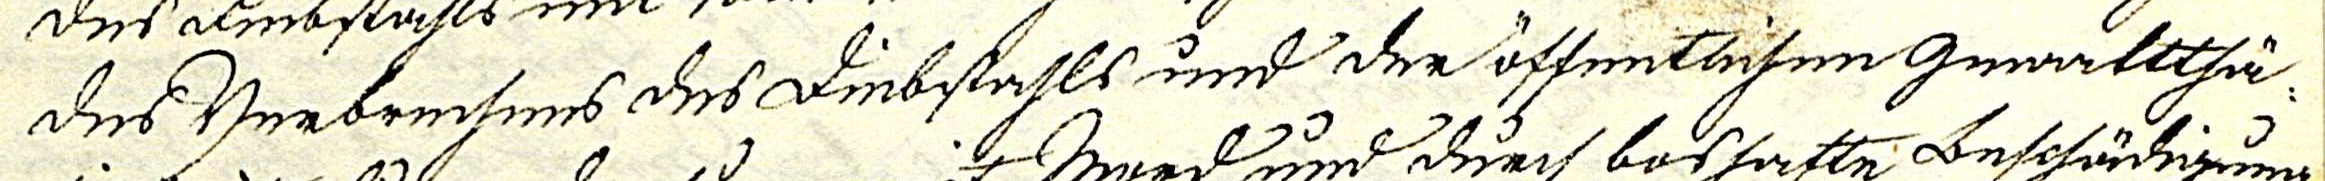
des Verbrechens des Diebstahls und der öffentlichen Gewaltthä¬
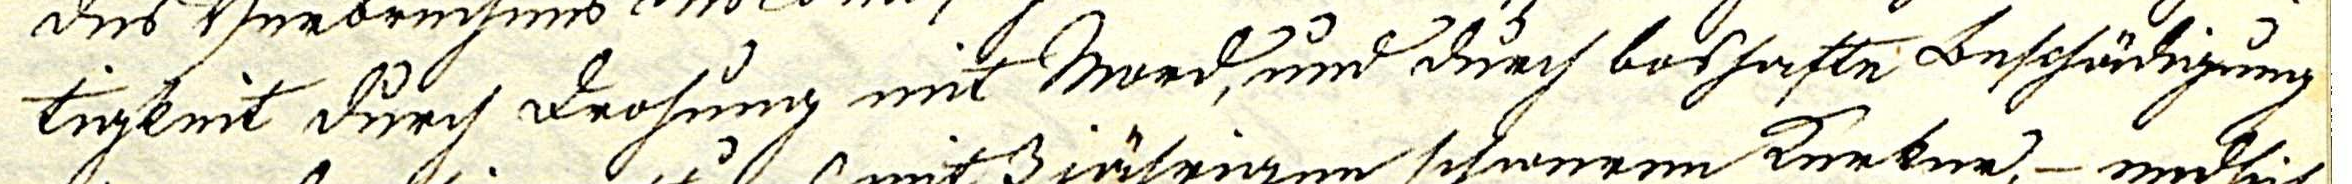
tigkeit durch Drohung mit Mord, und durch boshafte Beschädigung
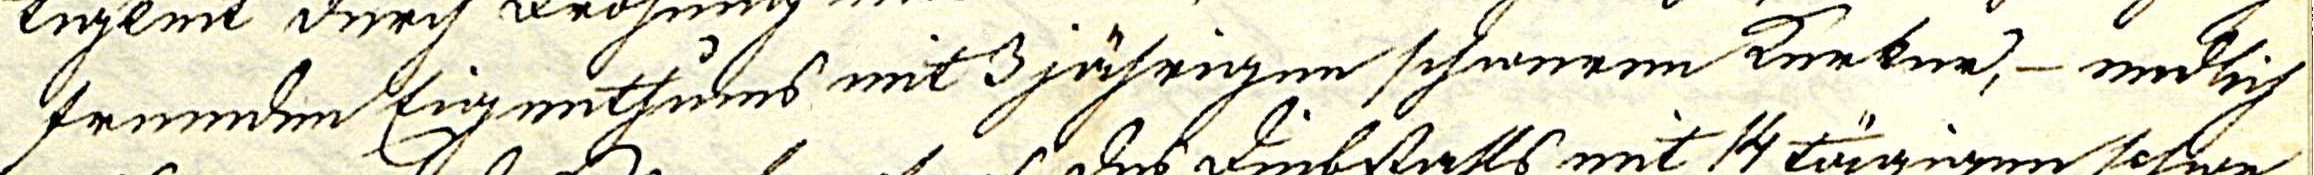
fremden Eigenthumes mit 3jährigen schwerem Kerker, - endlich
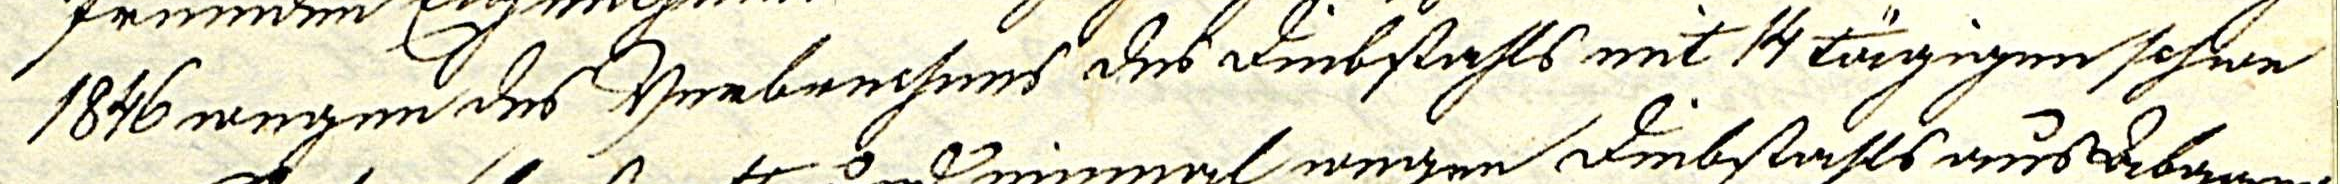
1846 wegen des Verbrechens des Diebstahls mit 14tägigen schwa¬
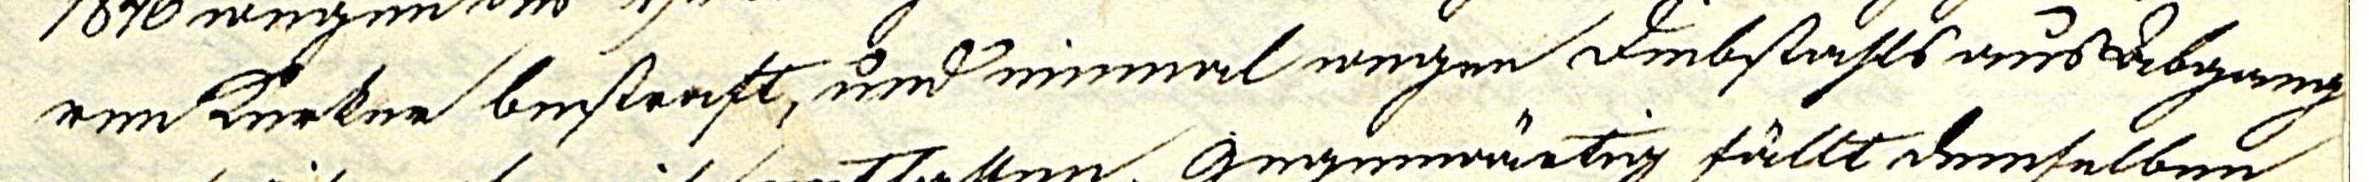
ren Kerker bestraft, und einmal wegen Diebstahls aus Abgang
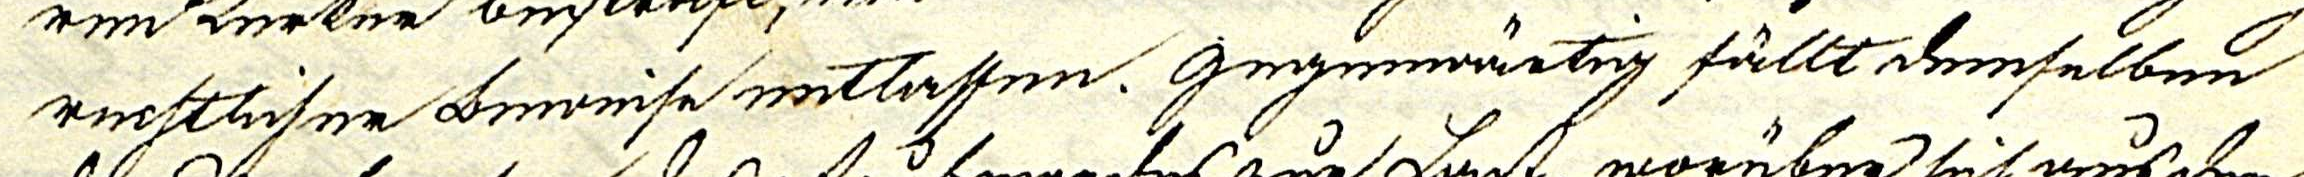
rechtlicher Beweise entlassen. Gegenwärtig fällt demselben
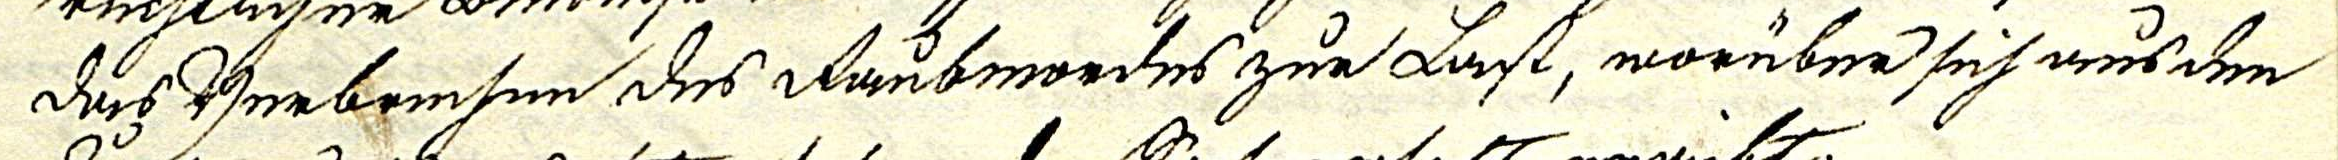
das Verbrechen des Raubmordes zur Last, worüber sich aus den
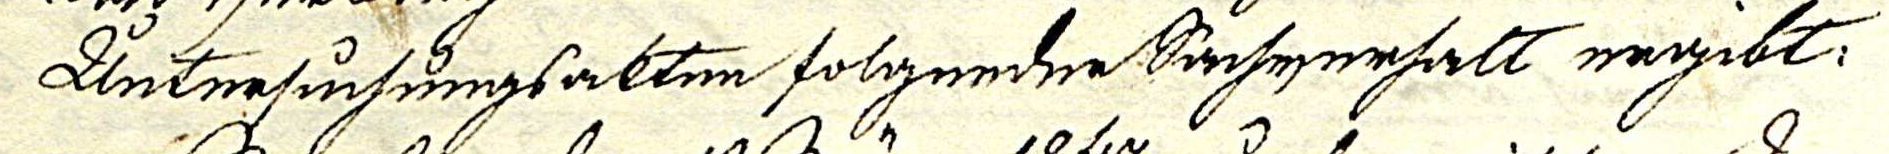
Untersuchungsakten folgender Sachverhalt ergibt:
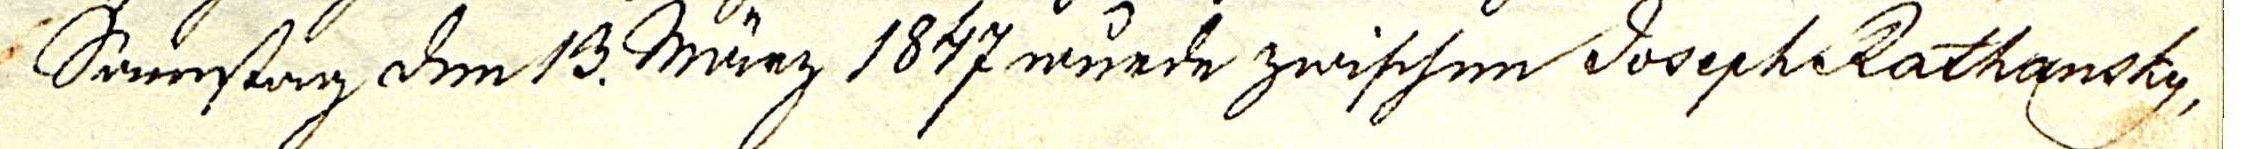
Samstag den 13. März 1847 wurde zwischen Joseph Rathausky,
